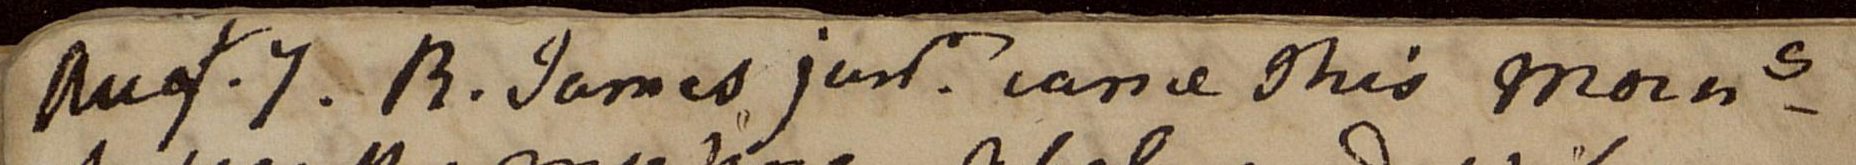Aug^t. 7. R. James jun^r. came This Morn^g-
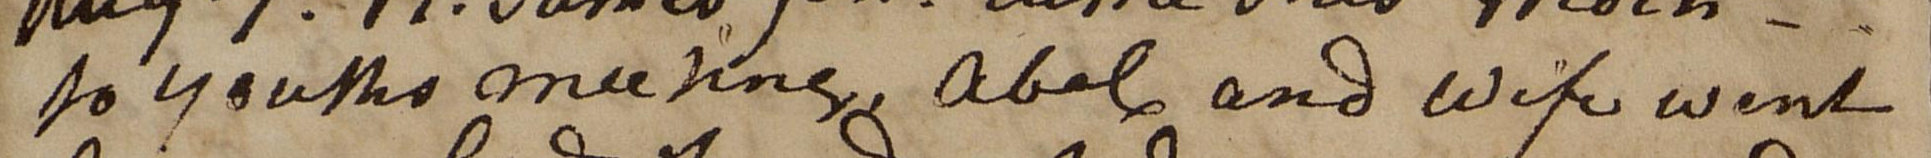to youths meeting, Abel and wife went
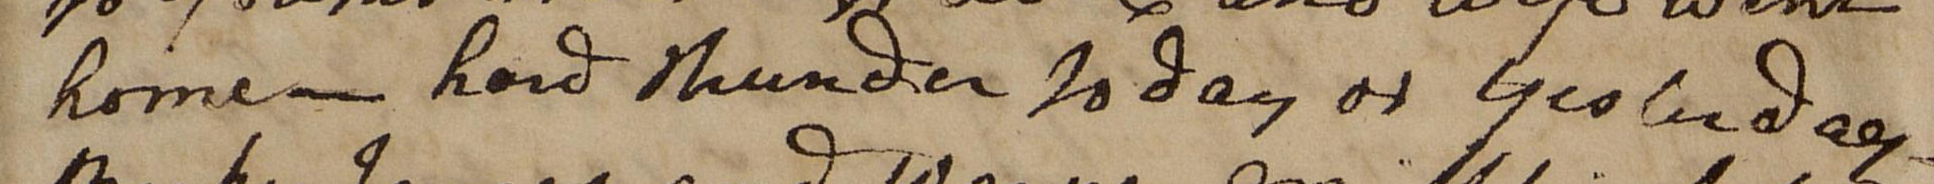home- hard thunder today or yesterday
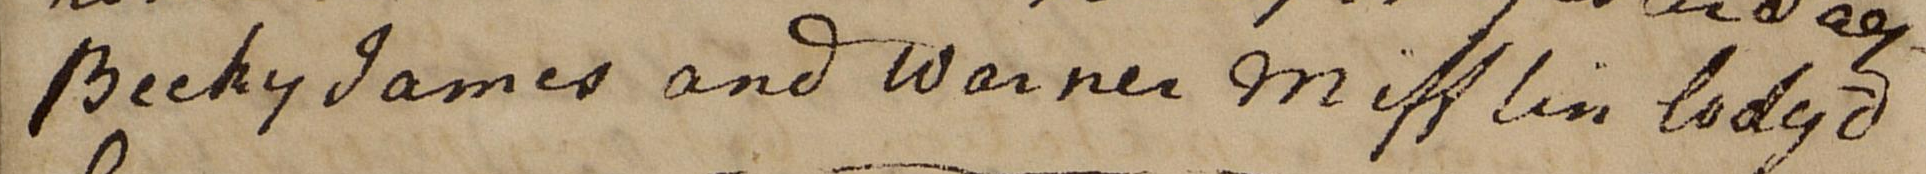Becky James and Warner Mifflin lodg'd
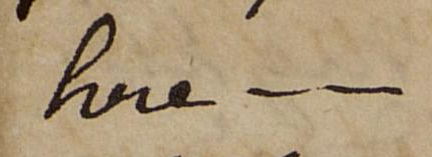here-
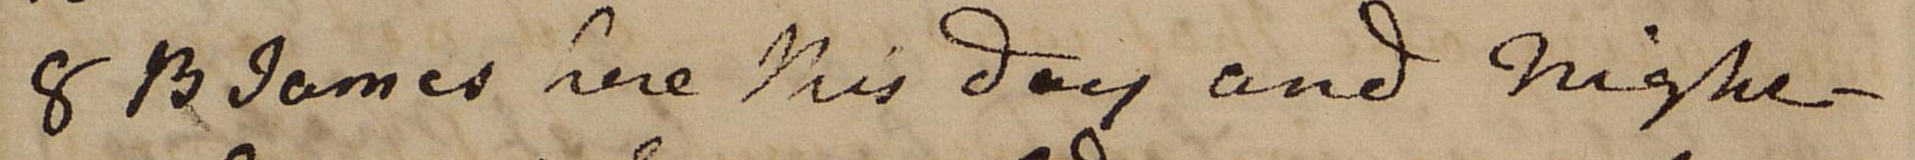8 B James here this day and Nighe-
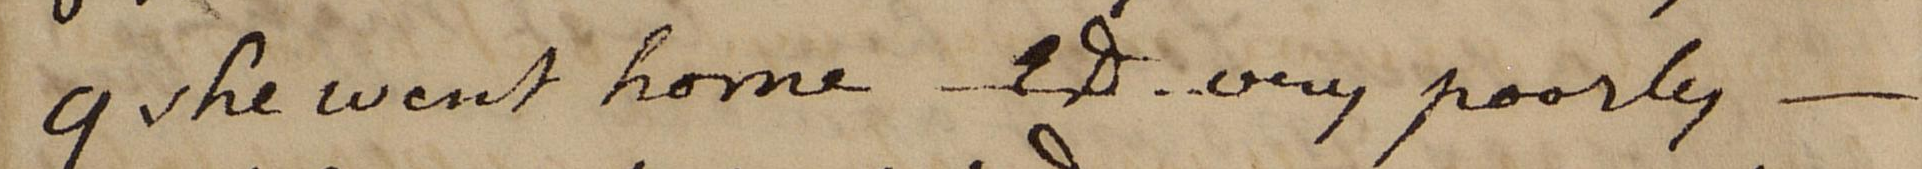9 she went home ED very poorly-
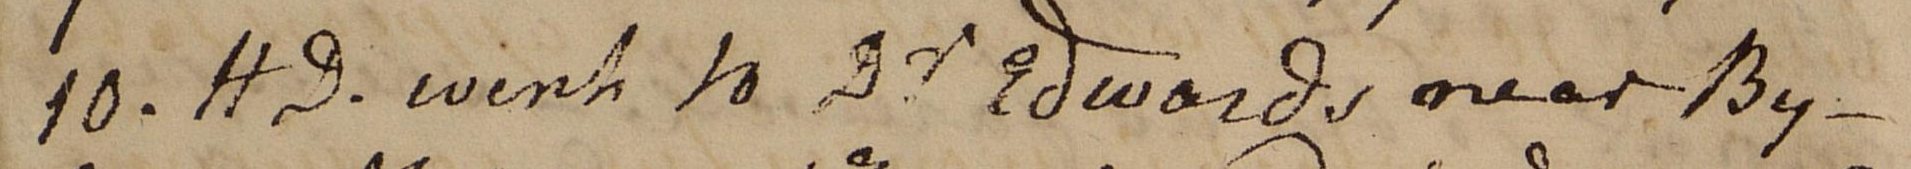10. H D. went to D^r. Edwards near By-
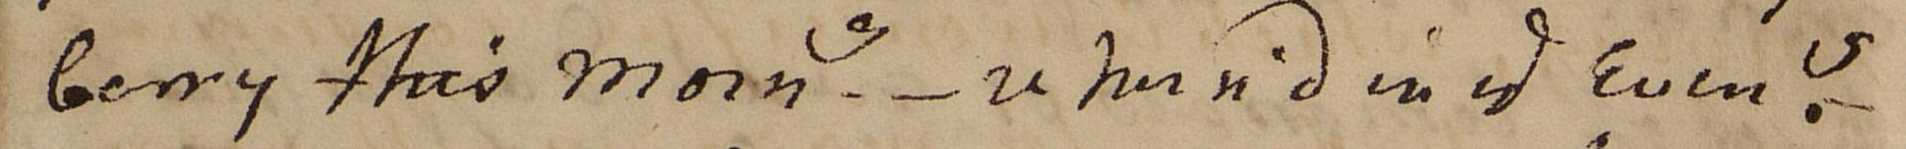barry this morn^g-- return'd in y^e Even^g.
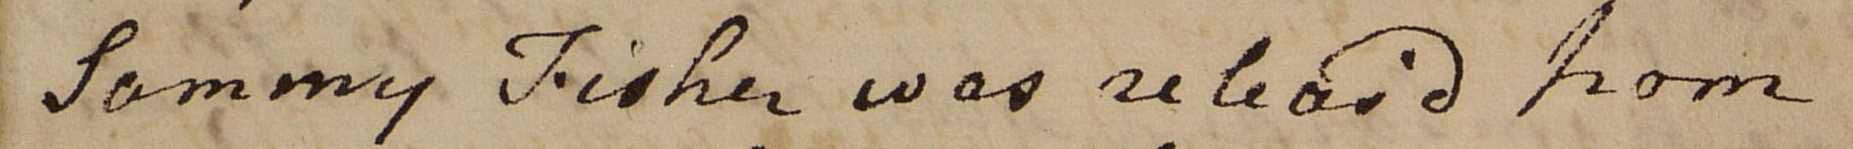Sammy Fisher was releas'd from
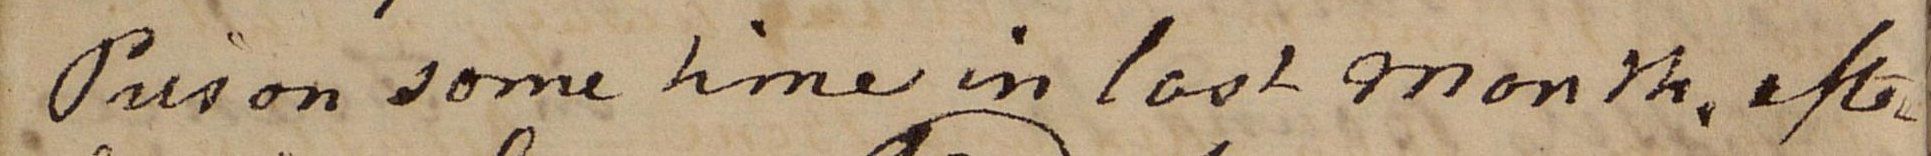Prison some time in last month, after
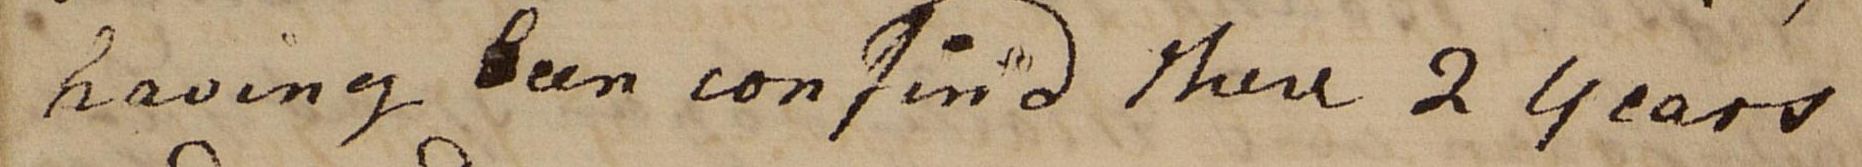having been confin'd there 2 years
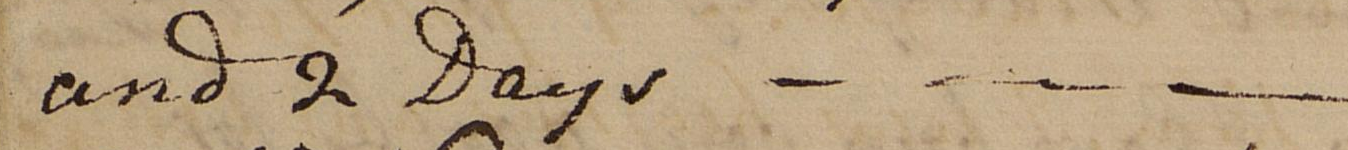and 2 Days----
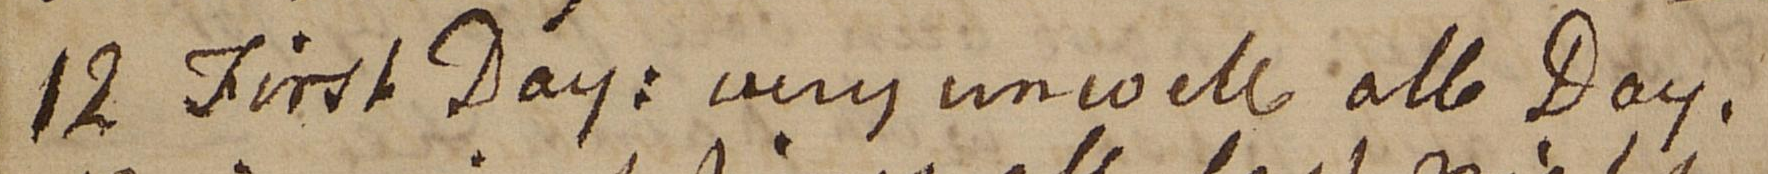12 First Day: very unwell all Day,
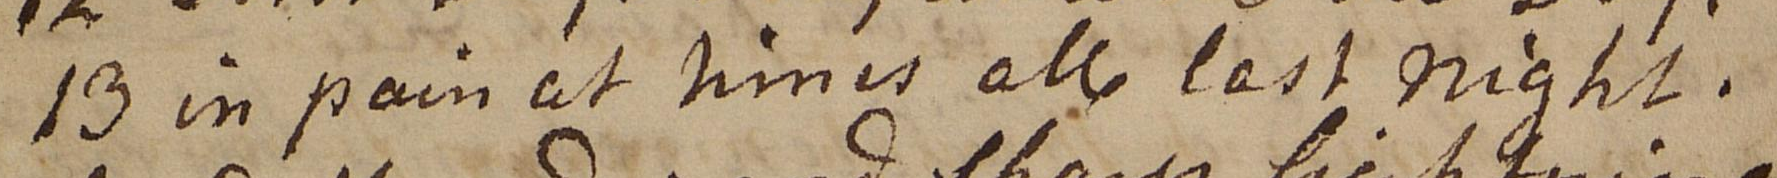13 in pain at times all last night.
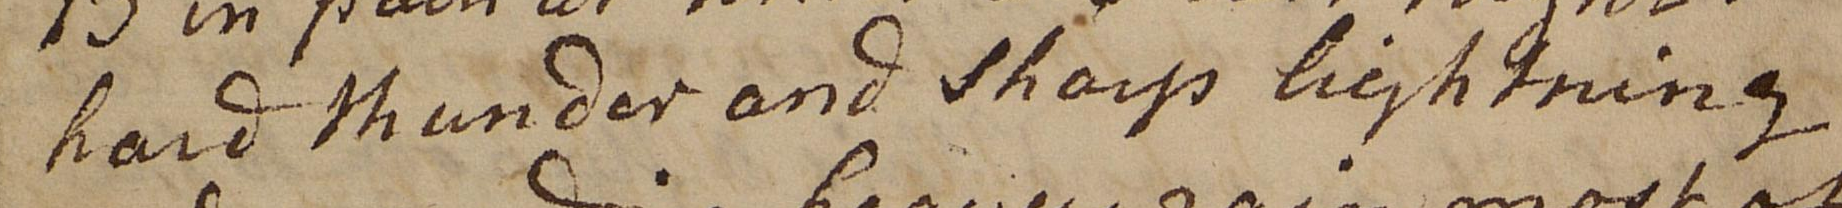hard thunder and sharp lightning
